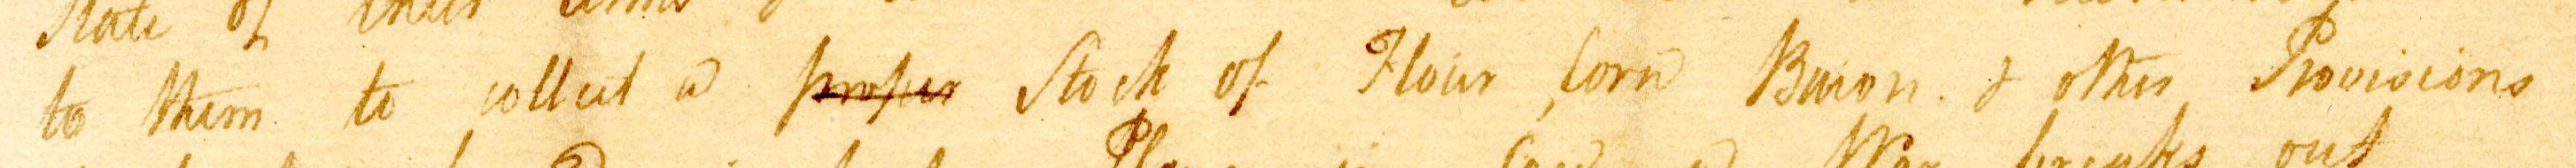to them to collect a proper Stock of Flour, Corn Bacon & other Provisions
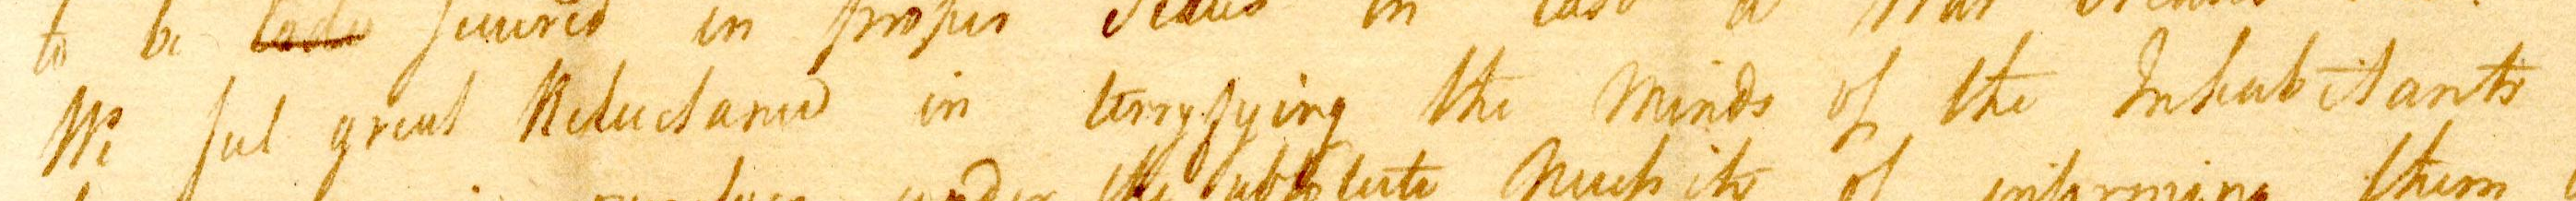We feel great Reluctance in terrifying the minds of the Inhabitants
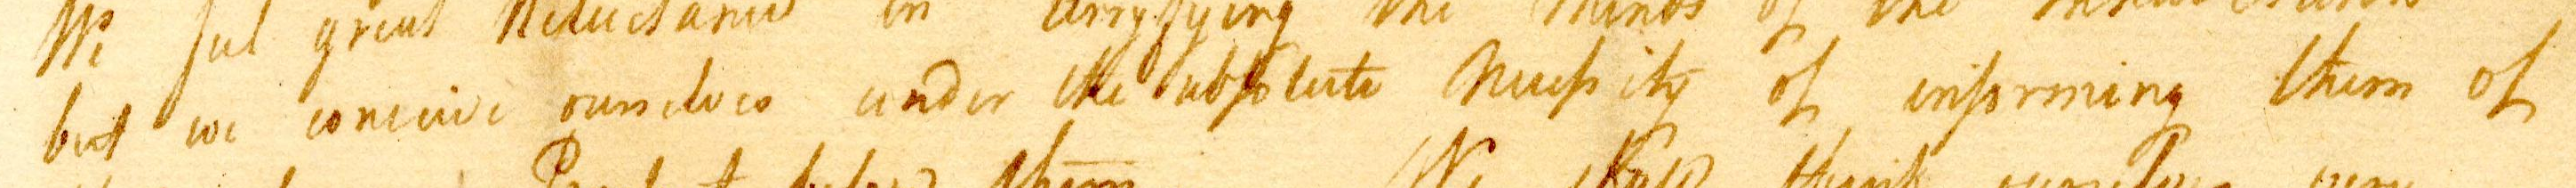but we conceive ourselves under the absolute neccessity of informing them of
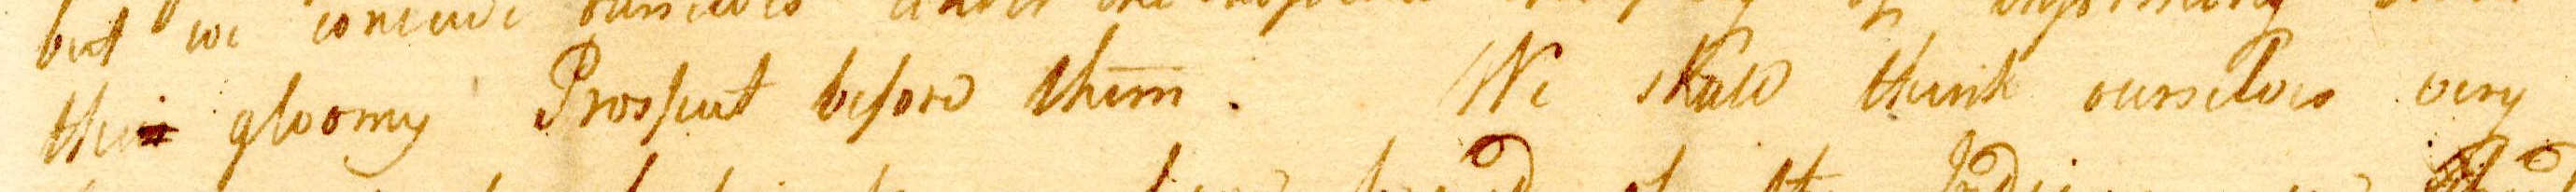the gloomy Prospect before them. We shall think ourselves very
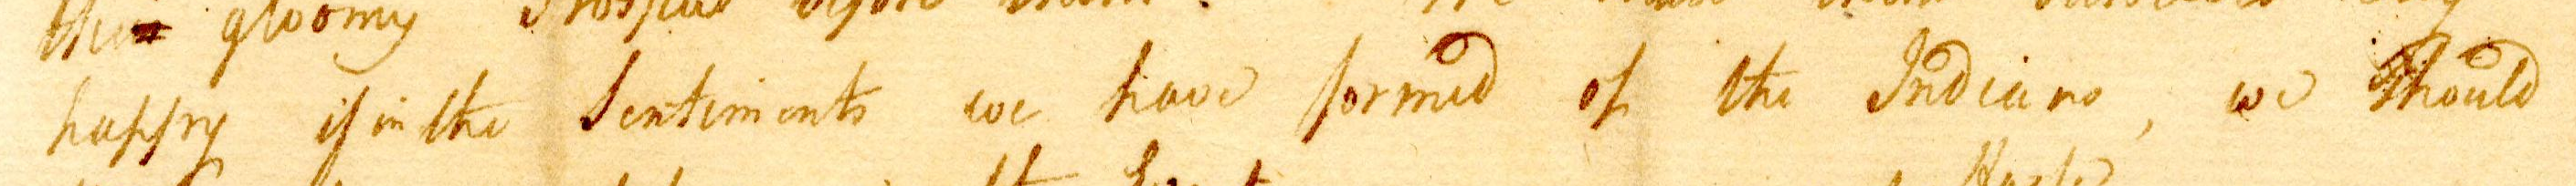happy if or the Sentiments we have formed of the Indians we should
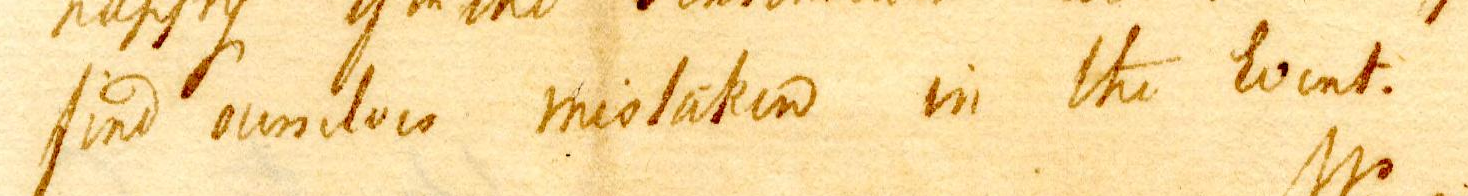find ourselves mistaken in the Event.
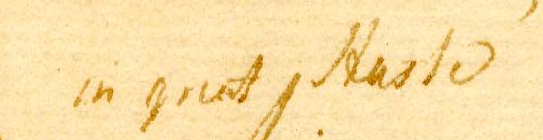in great Haste
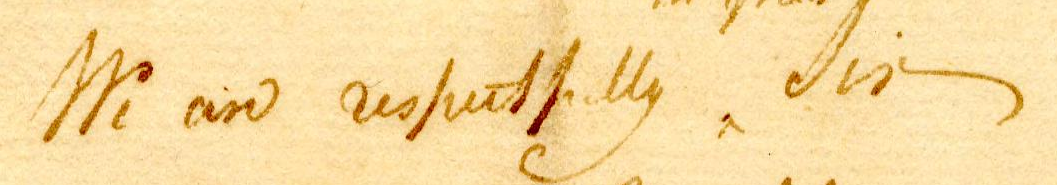We are respectfully Sir
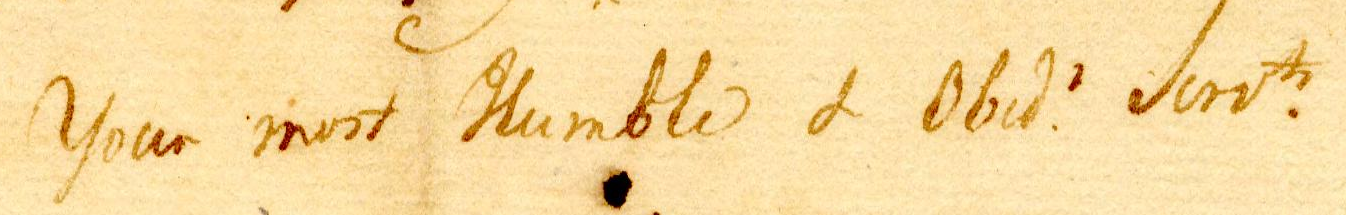Your most Humble & Obed^t. Serv^t.
